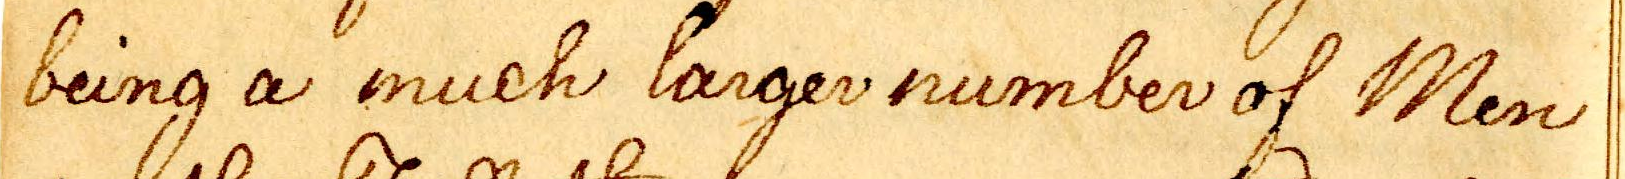being a much larger number of Men
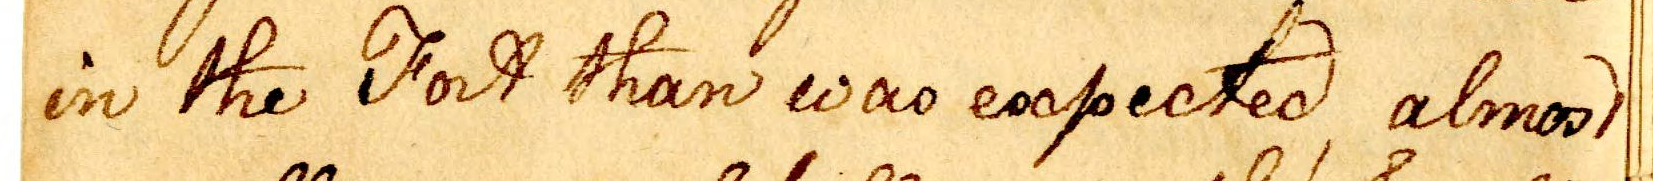in the Fort than was expected, almost
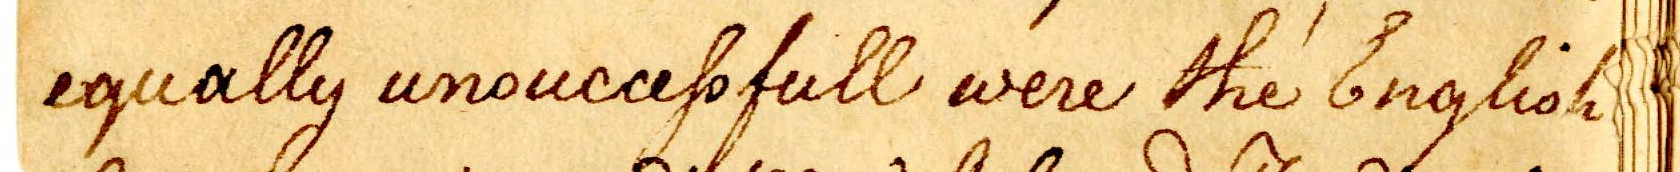equally unsuccessfull were the English
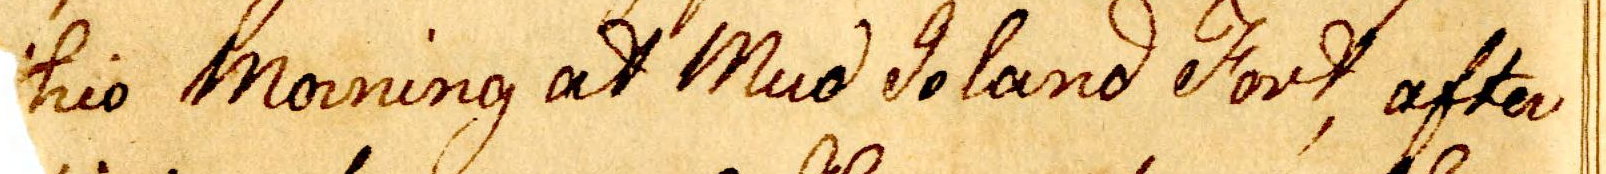[t]his Morning at Mud Island Fort, after
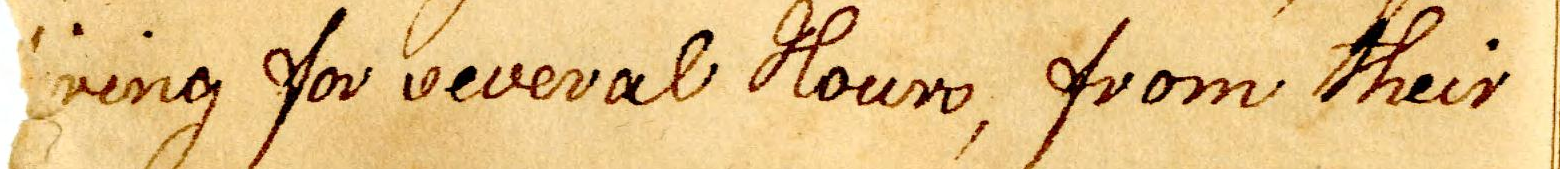ving for several Hours, from their
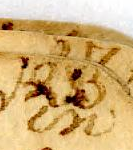23
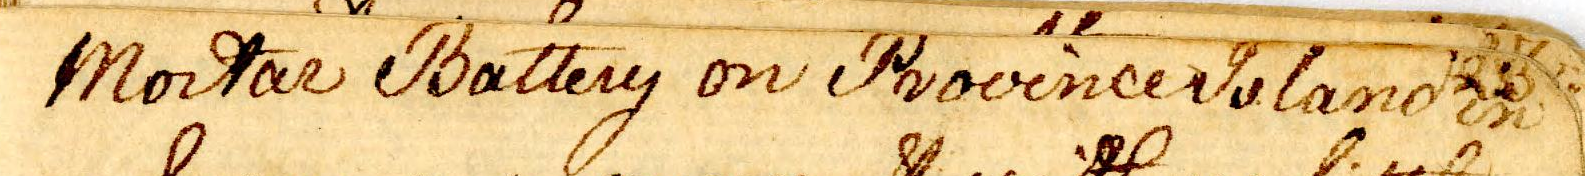Mortar Battery on Province Island in
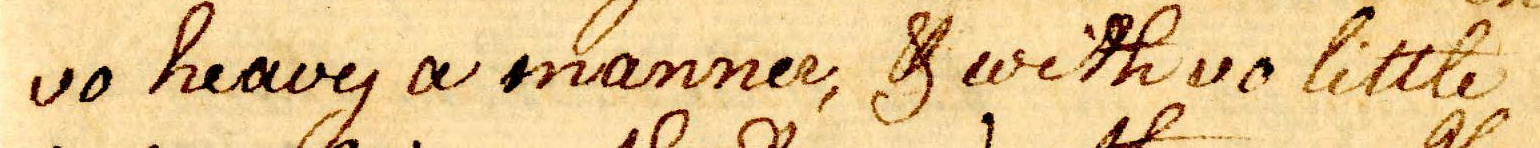so heavy a manner, & with so little
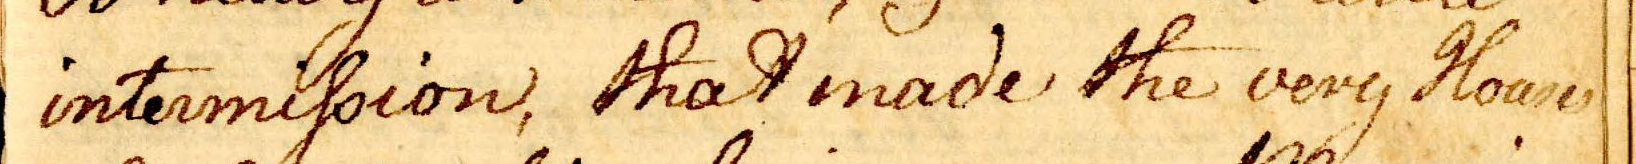intermission, that made the very Houses
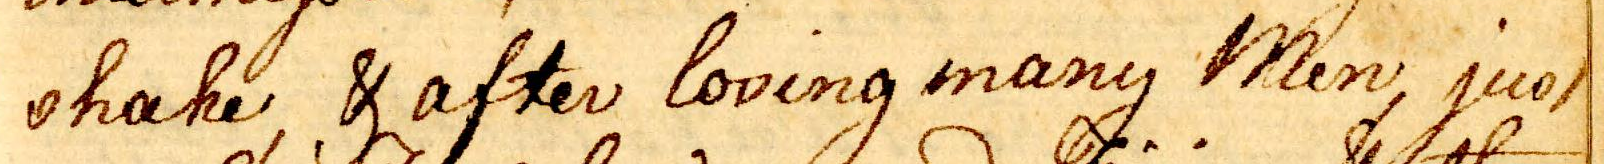shake & after losing many Men, just
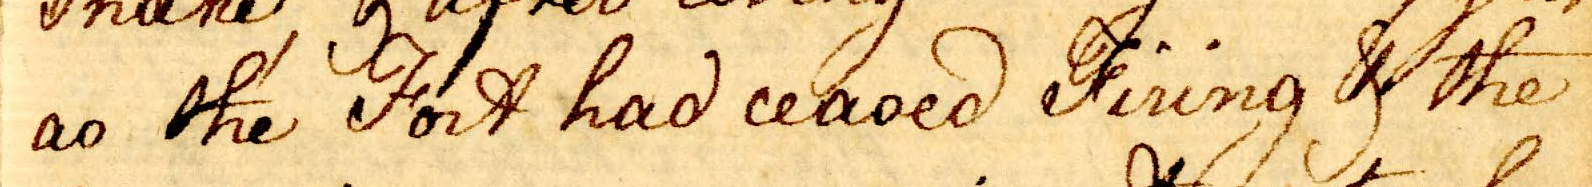as the Fort had ceased Firing & the
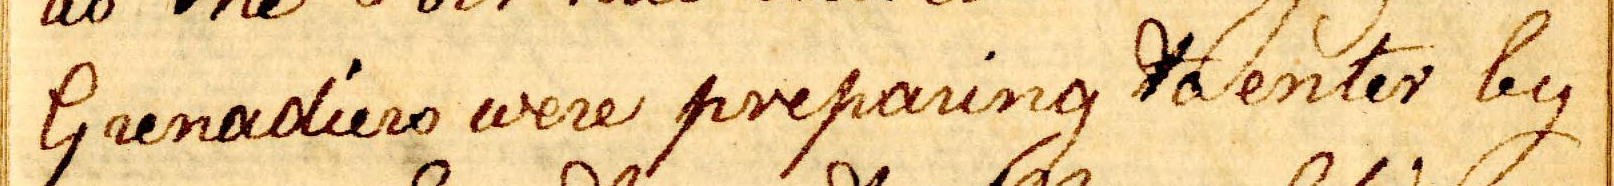Grenadiers were preparing to enter by
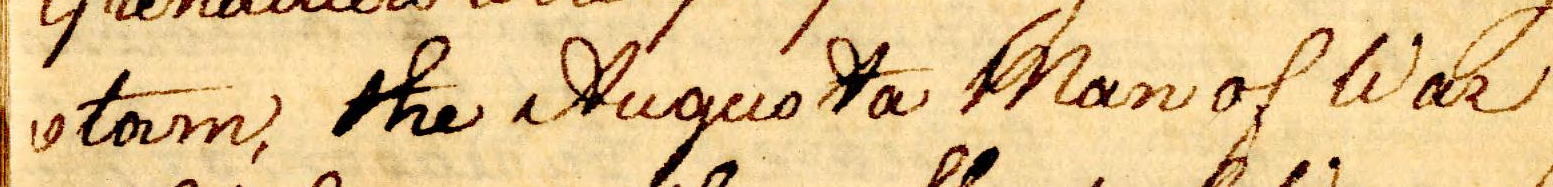storm, the Augusta Man of War
